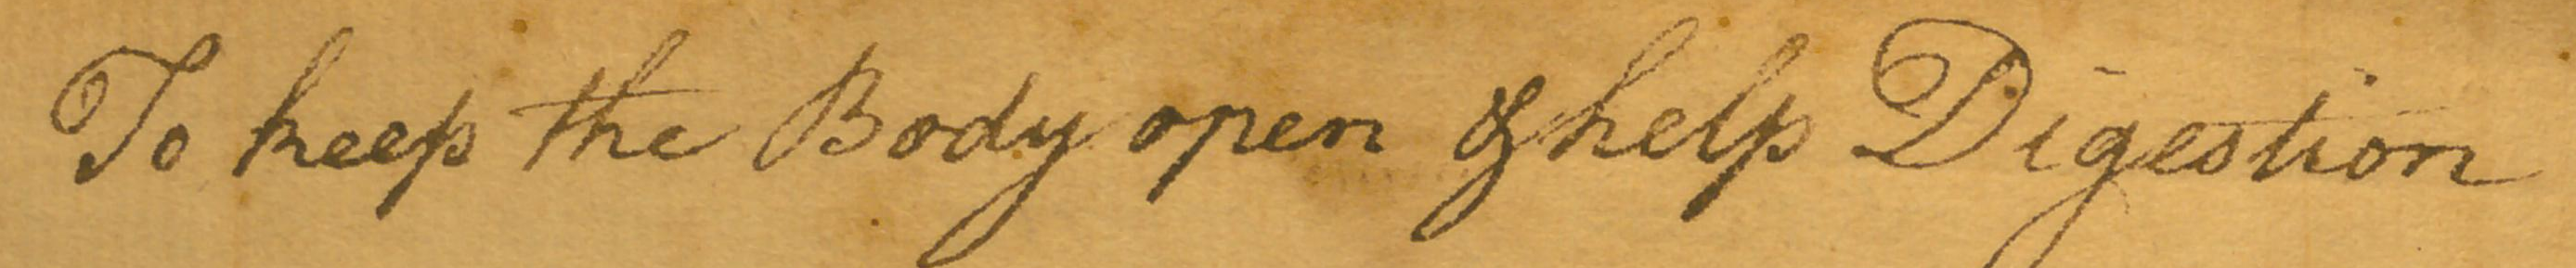To keep the Body open & help Digestion
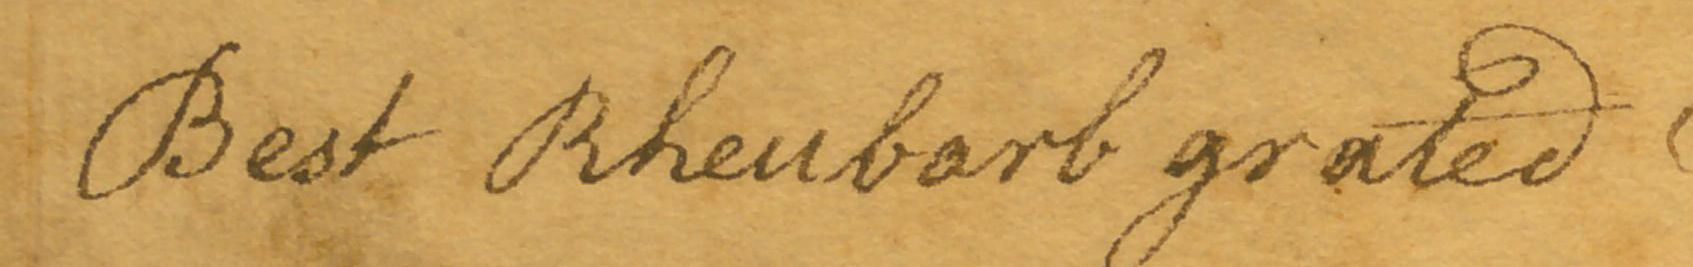Best Rheubarb grated
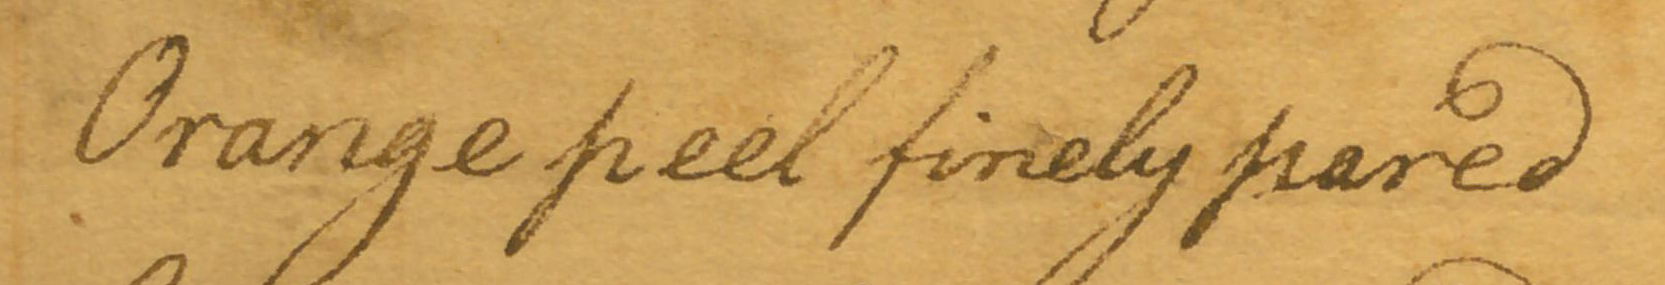Orange peel finely pared
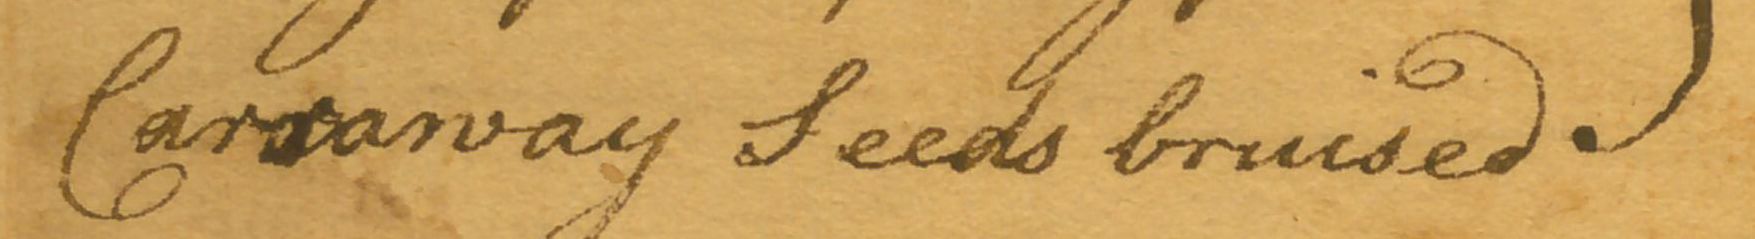Carraway seeds bruised
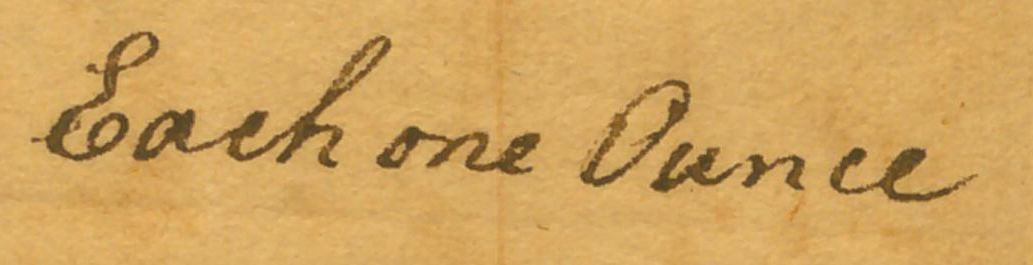Each one Ounce
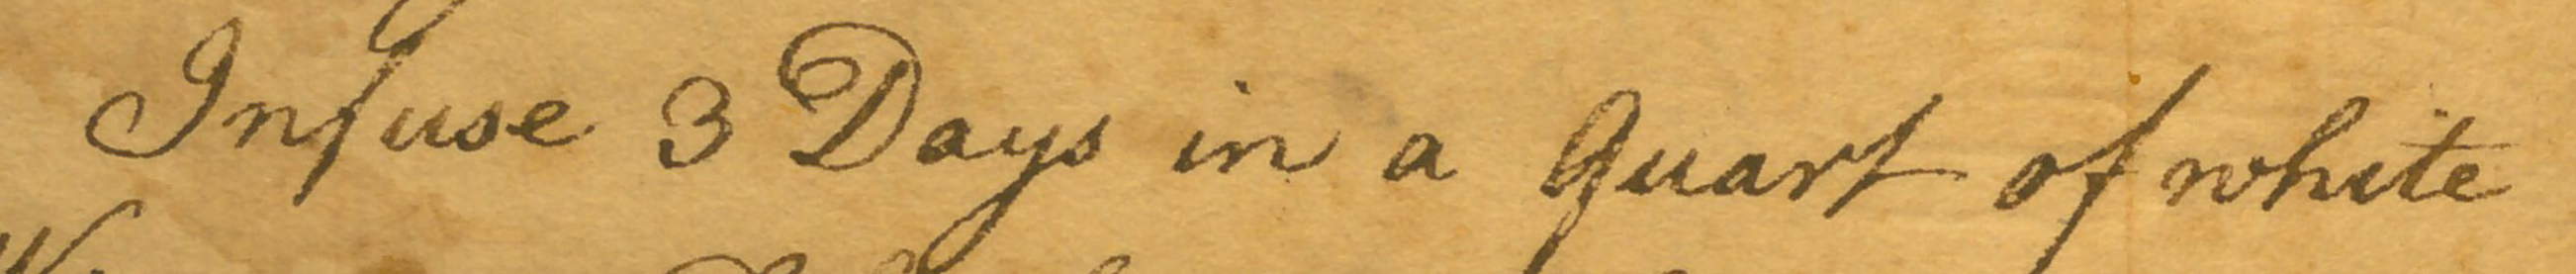Infuse 3 Days in a quart of white
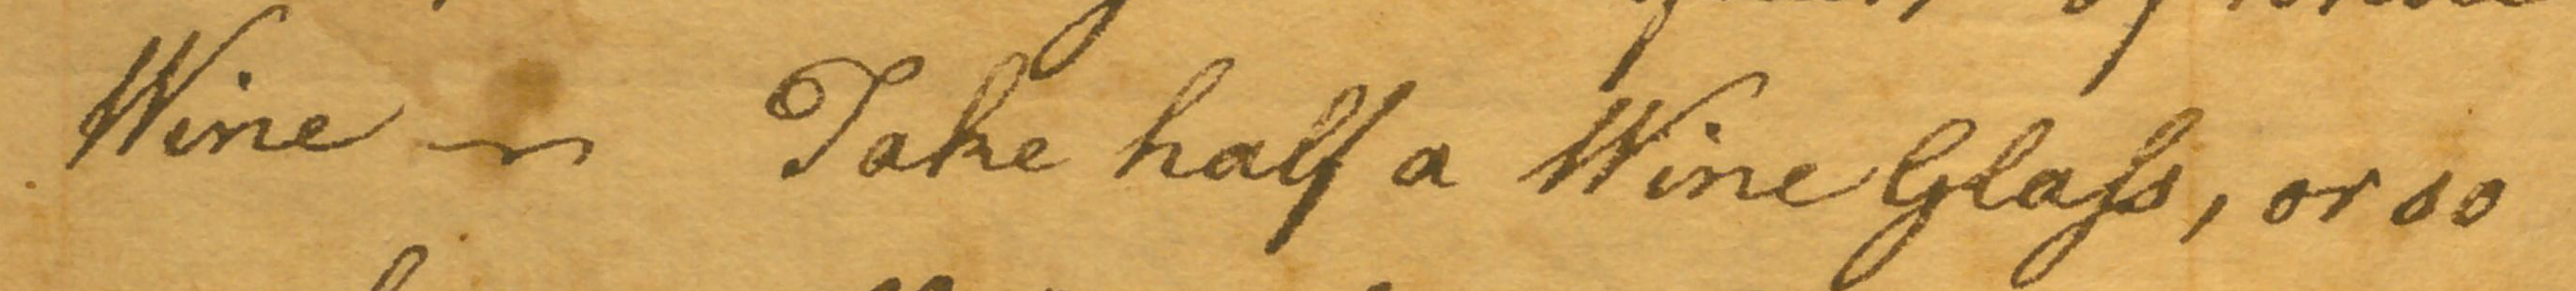Wine- Take half a Wine Glass, or so
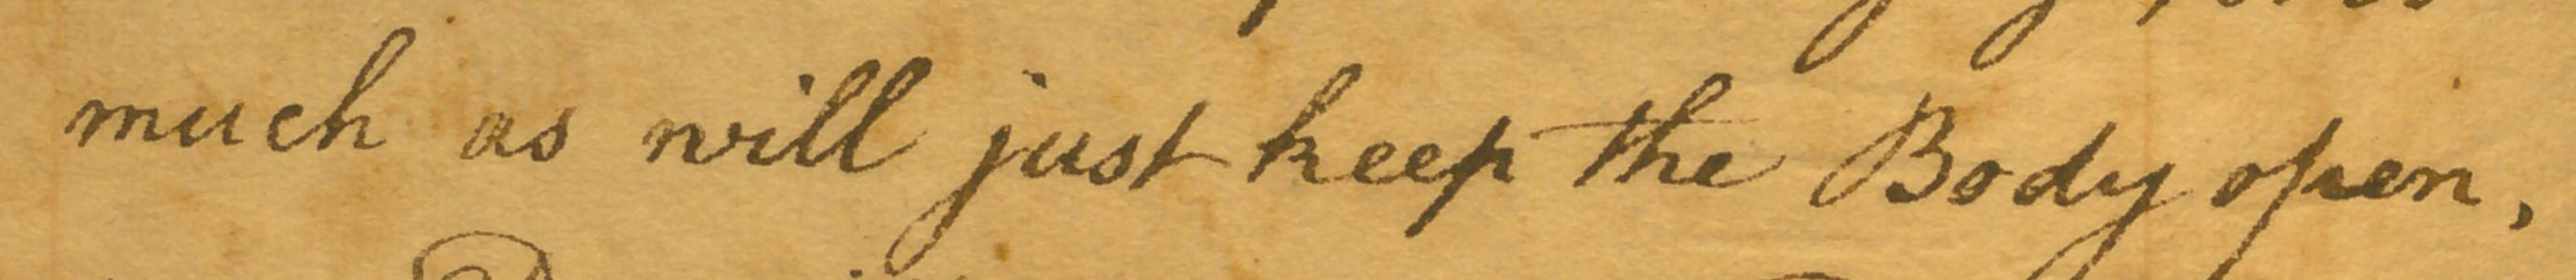much as will just keep the Body open,
